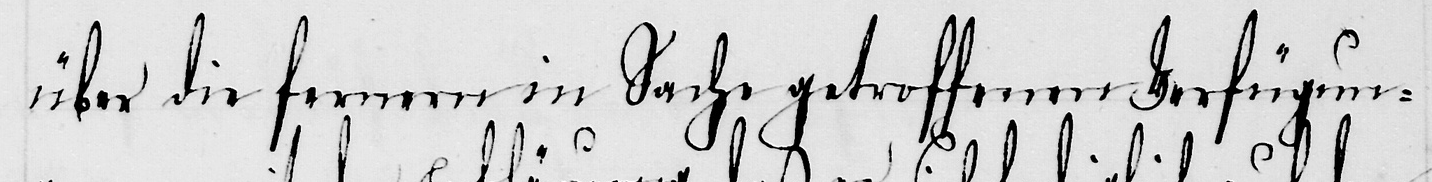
über die fernern in Sache getroffenen Verfügun¬
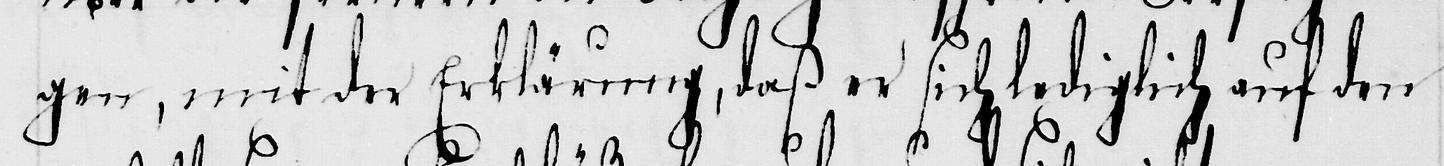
gen, mit der Erklärung, daß er sich lediglich auf den
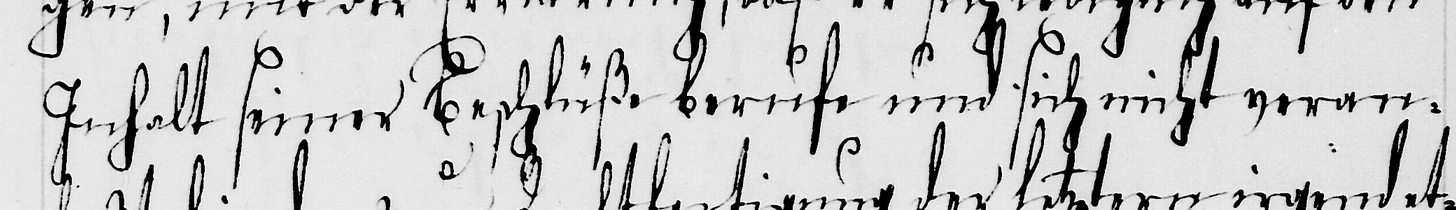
Inhalt seiner Beschlüße berufe und sich nicht veran¬
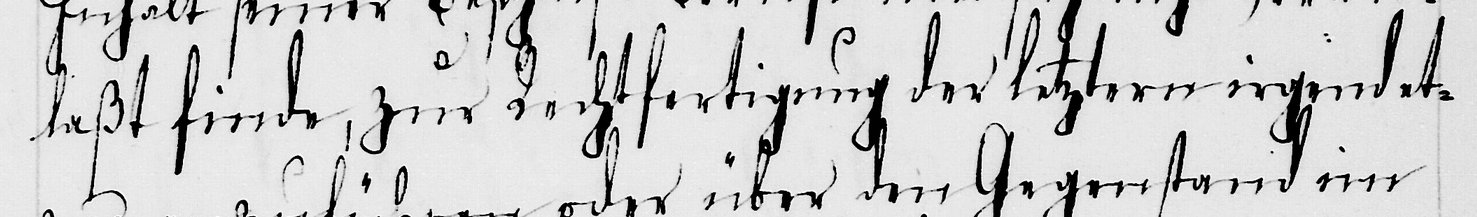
laßt finde, zur Rechtfertigung der Letztern irgend et¬
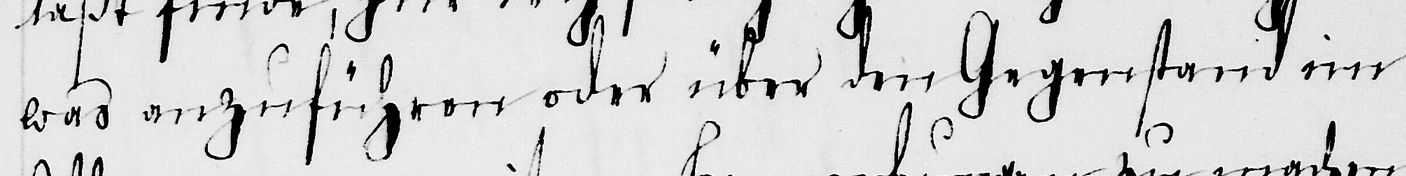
was anzuführen oder über den Gegenstand im
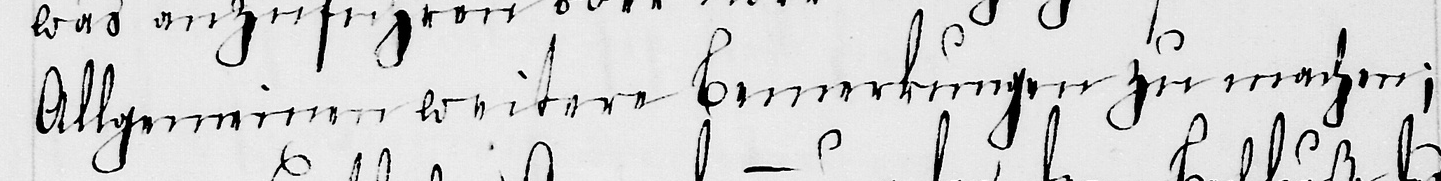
Allgemeinen weitere Bemerkungen zu machen;
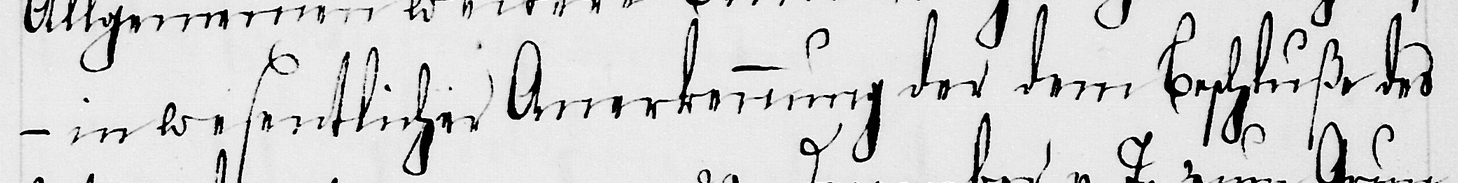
– in wesentlicher Anerkennung der dem Beschluße des
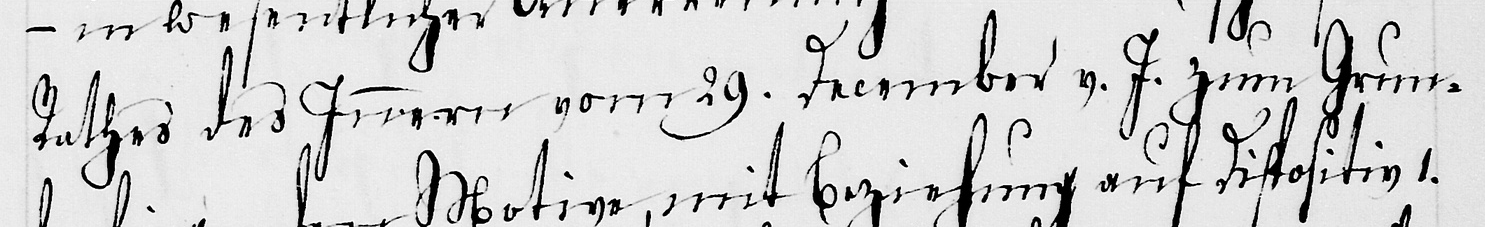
Rathes des Innern vom 29. December v. J. zum Grun¬
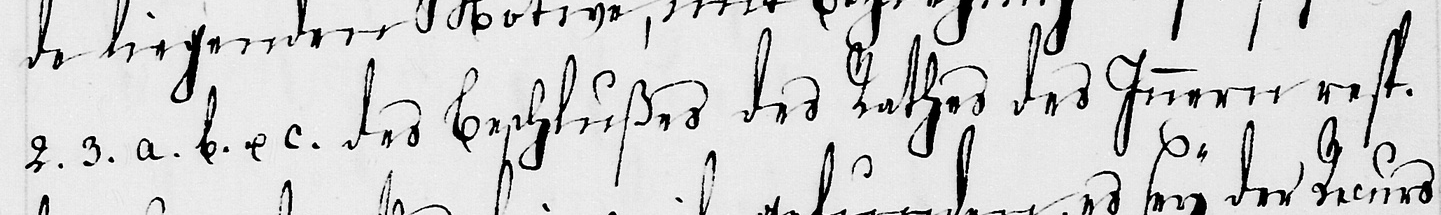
3. a. b. u. c. des Beschlußes des Rathes des Innern resp.
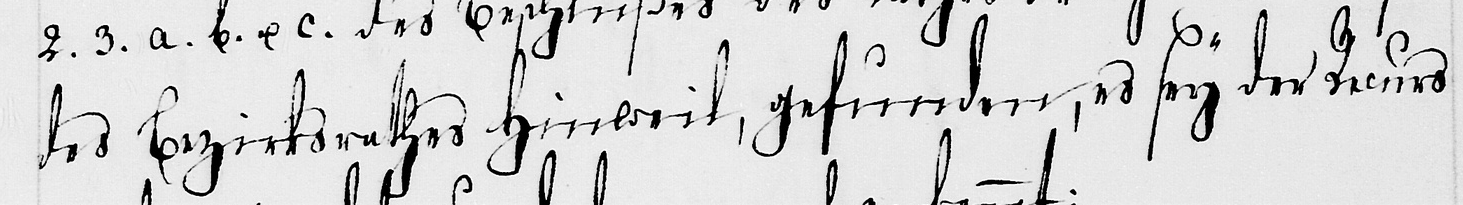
des Bezirksrathes Hinweil, gefunden, es sey der Recurs
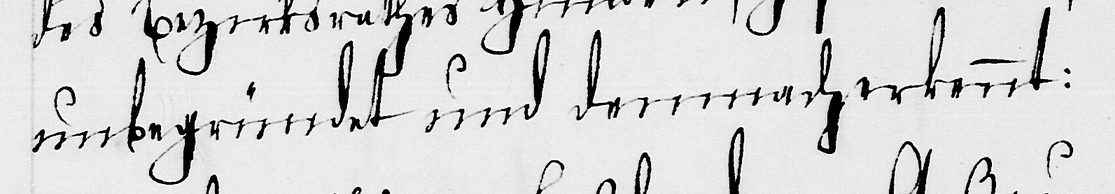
unbegründet und demnach erkennt:
